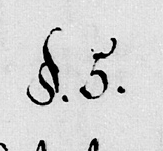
§. 5.
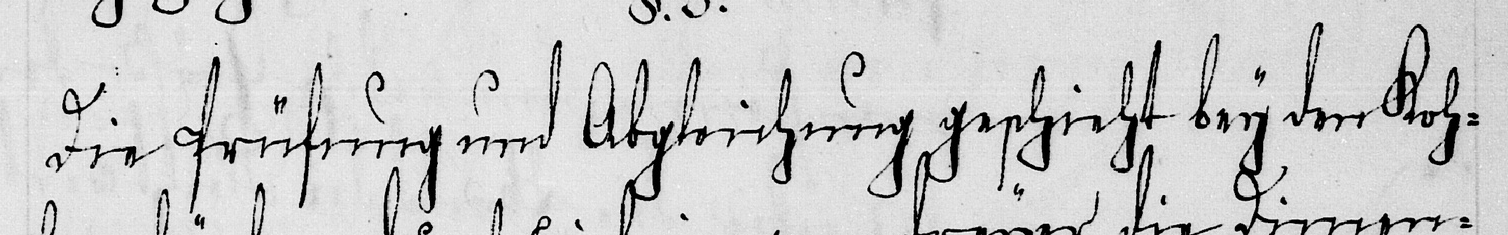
Die Prüfung und Abgleichung geschieht bey den
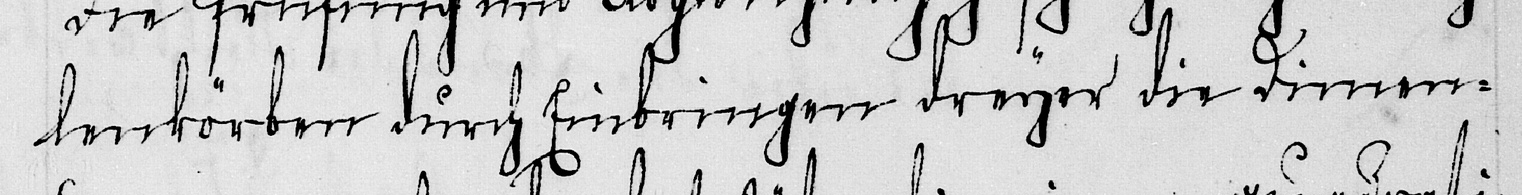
lenkörben durch Einbringen dreyer die Dimen¬
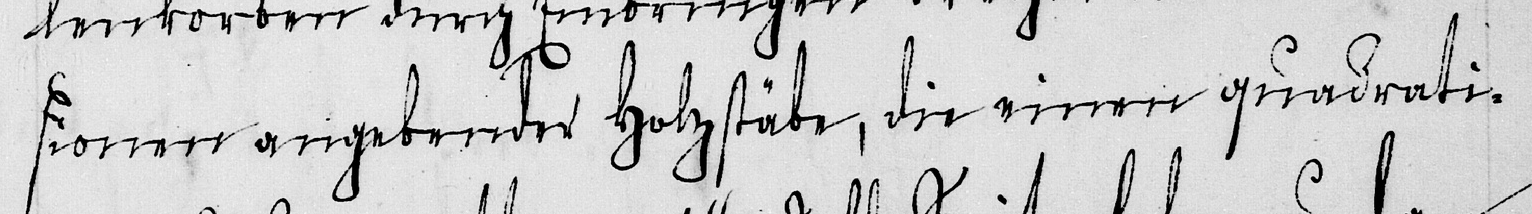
sionen angebender Holzstäbe, die einen quadrati¬
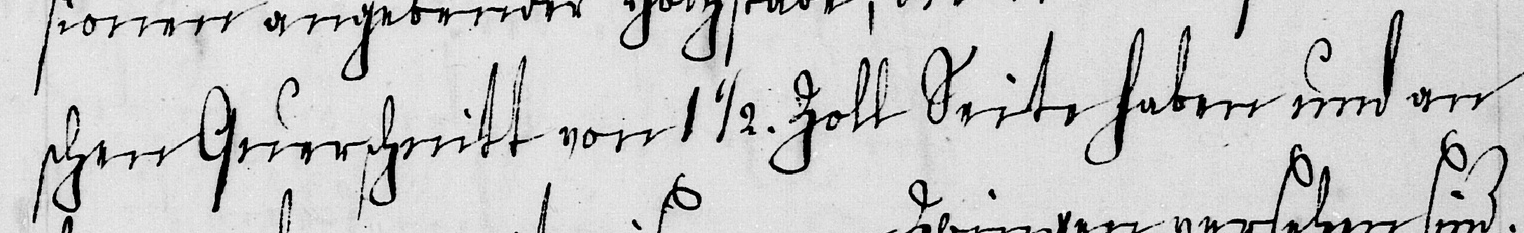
schen Querschnitt von 1 1/2. Zoll Seite haben und an
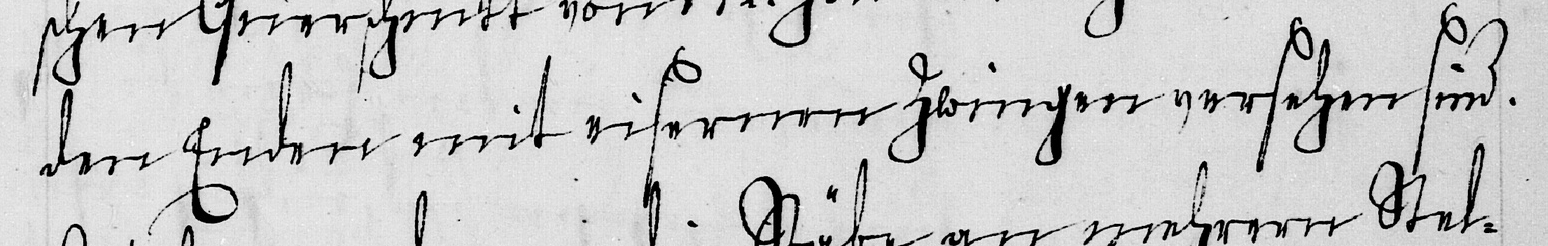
den Enden mit eisernen Zwingen versehen sind.
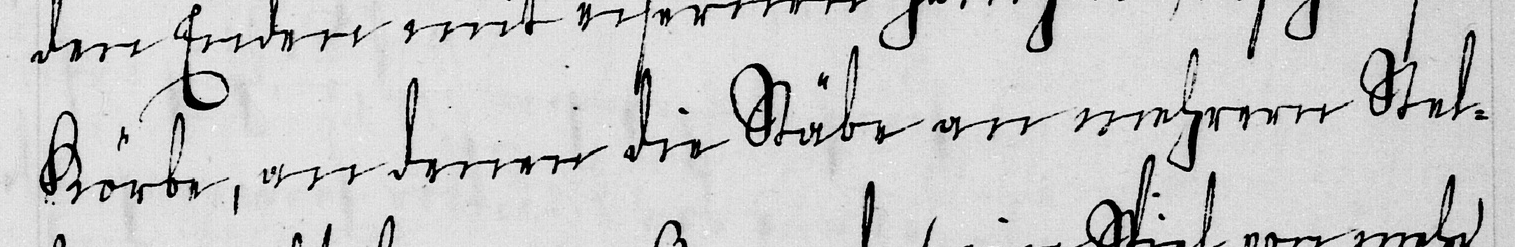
Körbe, an denen die Stäbe an mehrern Stel¬
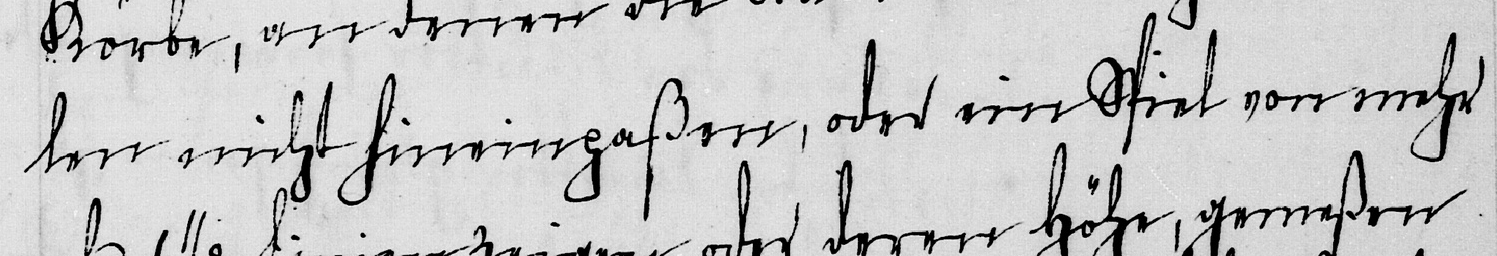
len nicht hineinpaßen, oder ein Spiel von mehr
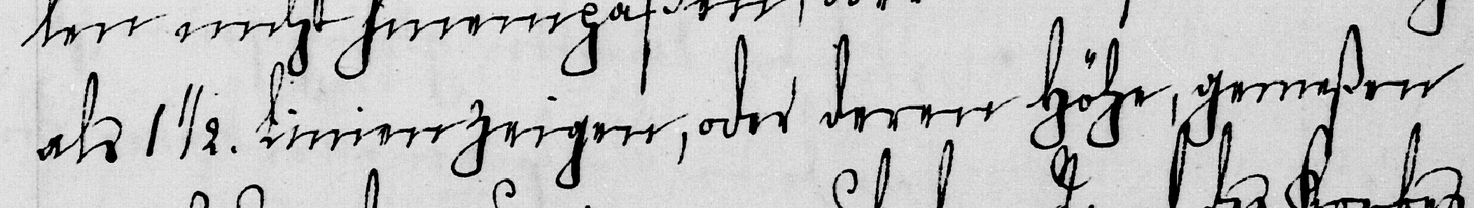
als 1 1/2. Linien zeigen, oder deren Höhe, gemeßen
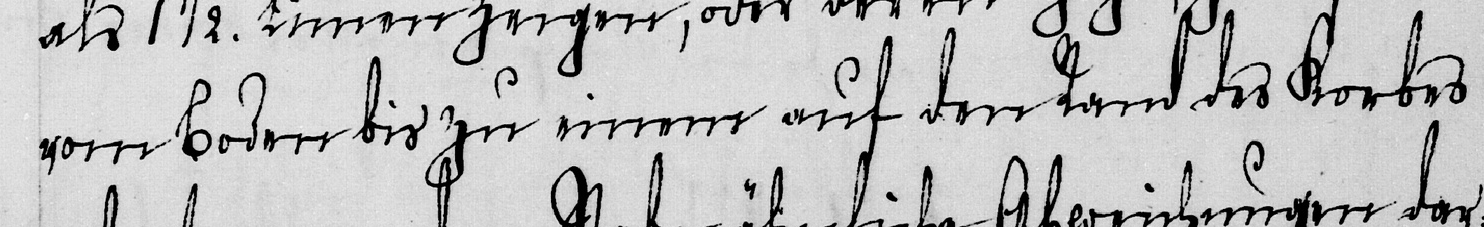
vom Boden bis zu einem auf den Rand des Korbes
